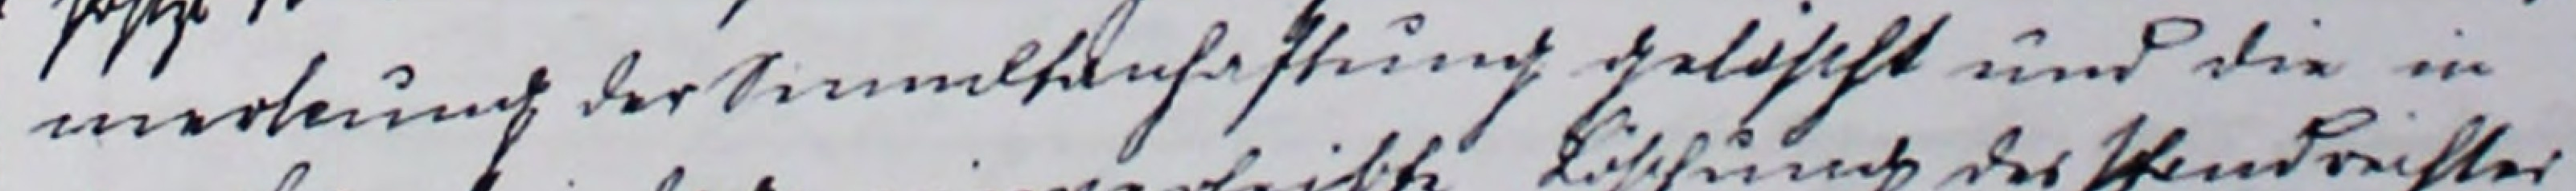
merkung der Simultanhaftung gelöscht und die in
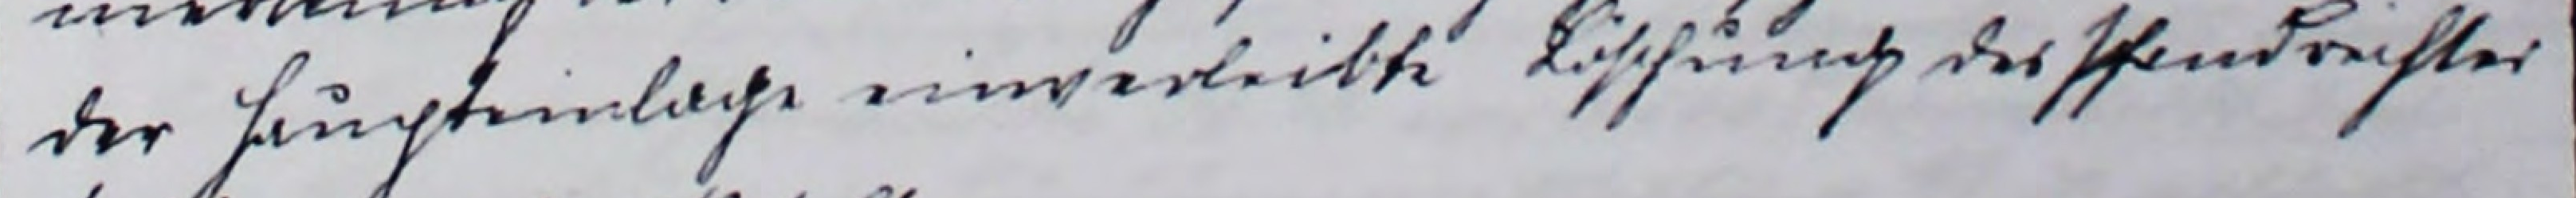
der Haupteinlage einverleibte Löschung des Pfandrechtes
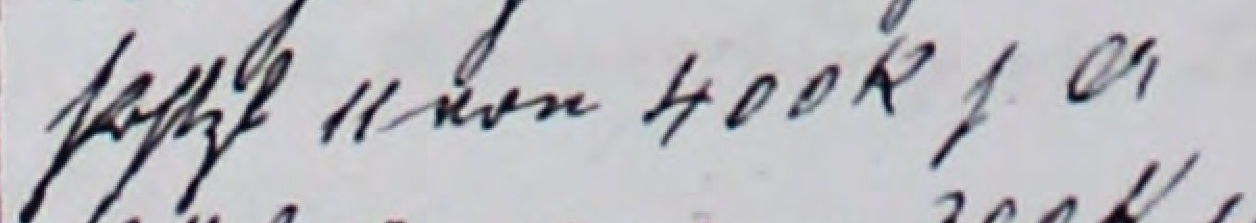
Postzl 11 von 400 K f. A
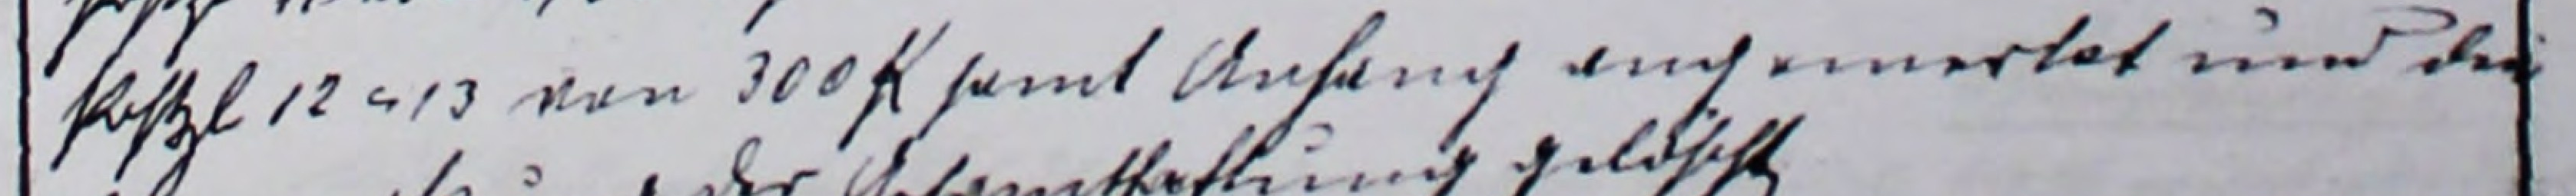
Postzl 12 4/3 von 300 K samt Anhang angemerkt und der
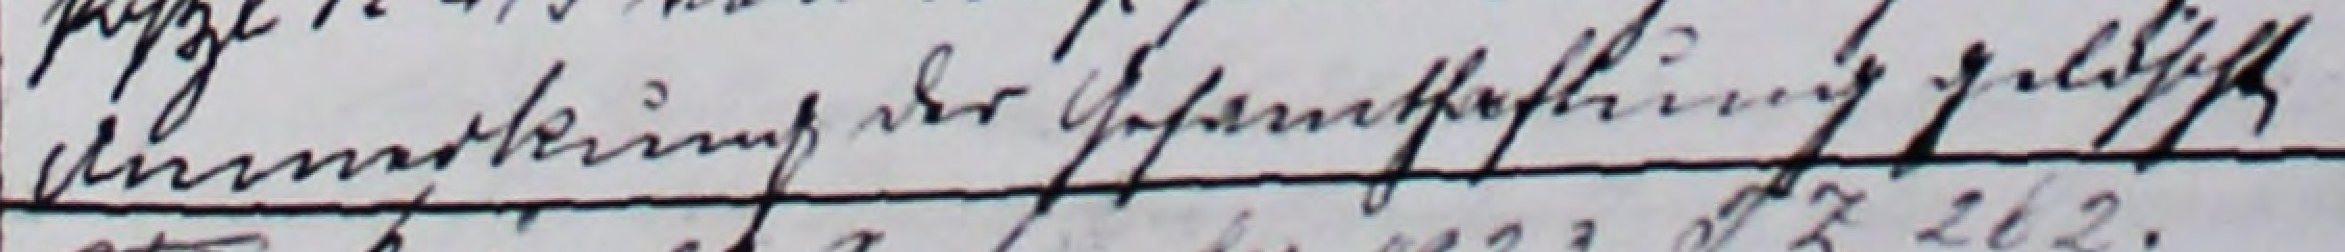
Anmerkung der Gesamthaftung gelöscht
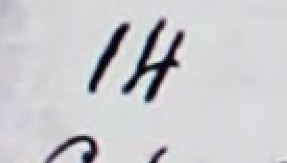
14
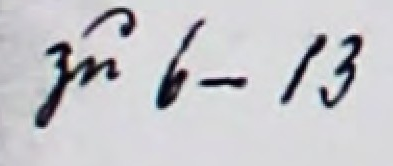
zu 6 - 13
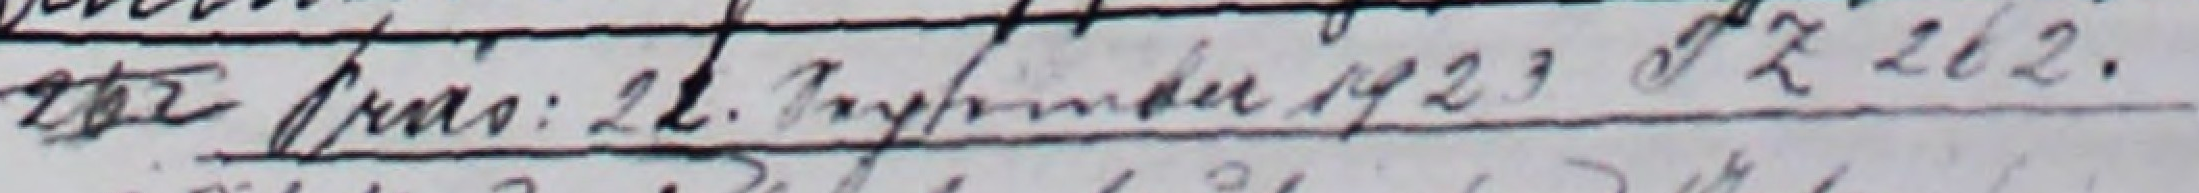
262 Präs: 22. September 1923 T Z 262.
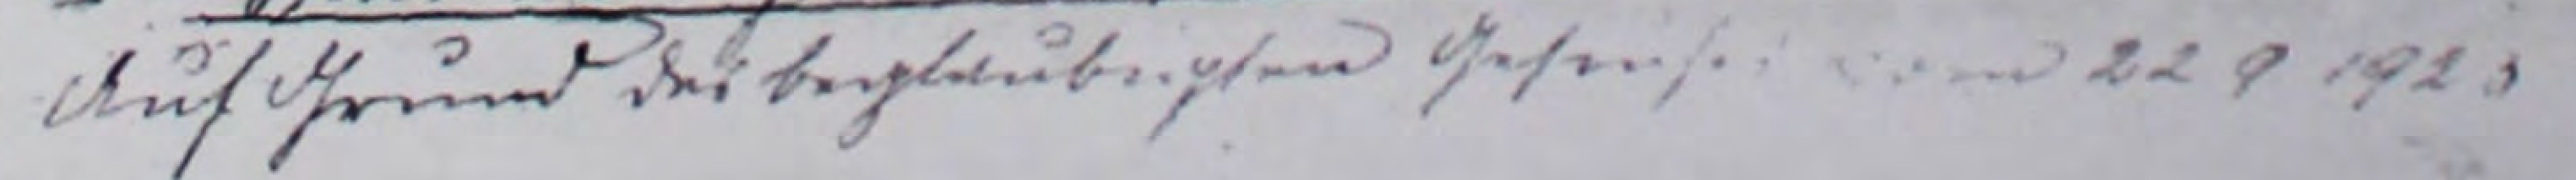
Auf Grund des beglaubigten Gesen??? vom 22.9.1923
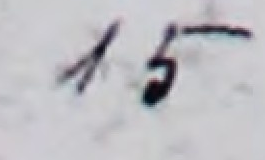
15
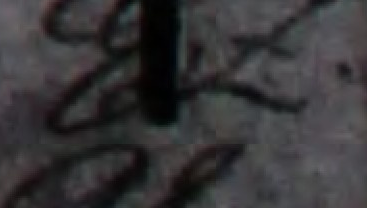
EZ.
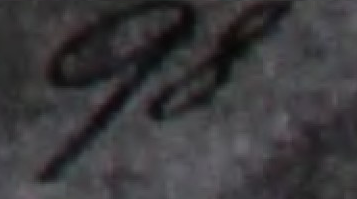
98
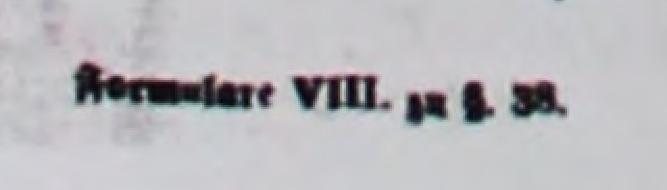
Formulare VIII. zu §. 38.
